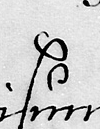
aus
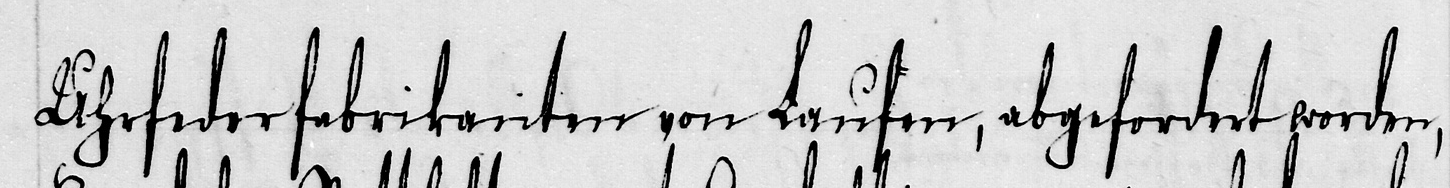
Uhrfederfabrikanten von Laufen, abgefordert worde¬
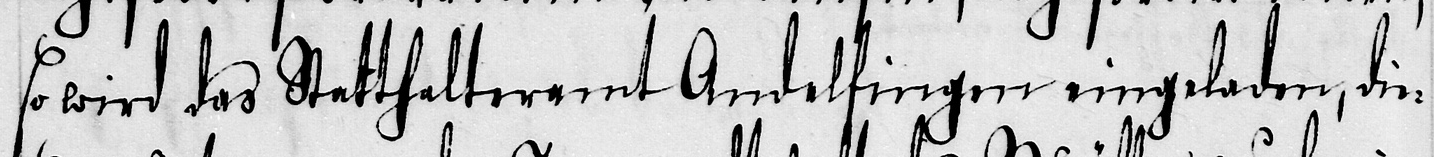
wird das Statthalteramt Andelfingen eingeladen, die¬
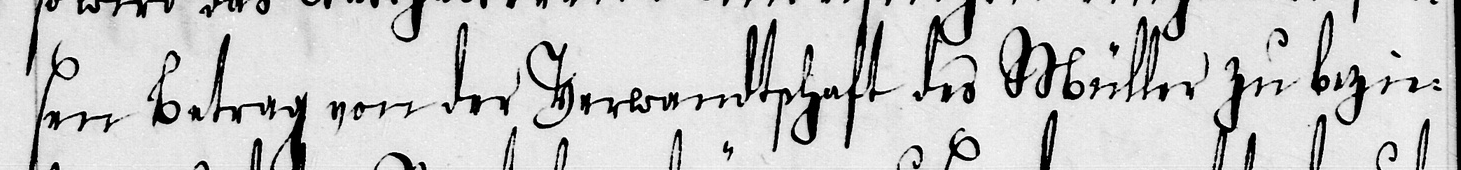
sen Betrag von der Verwandtschaft des Müller zu bezie¬
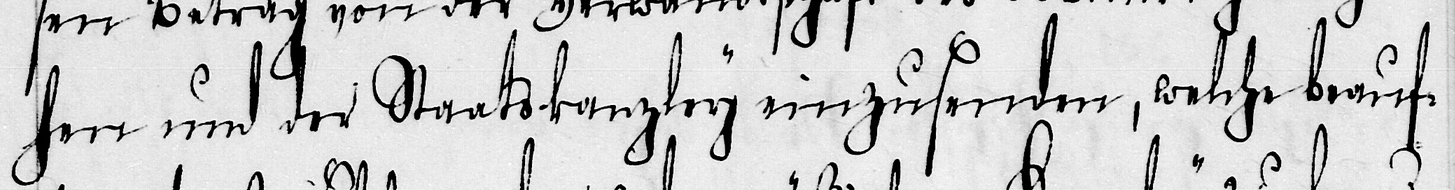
hen und der Staatskanzley einzusenden, welche beauf¬
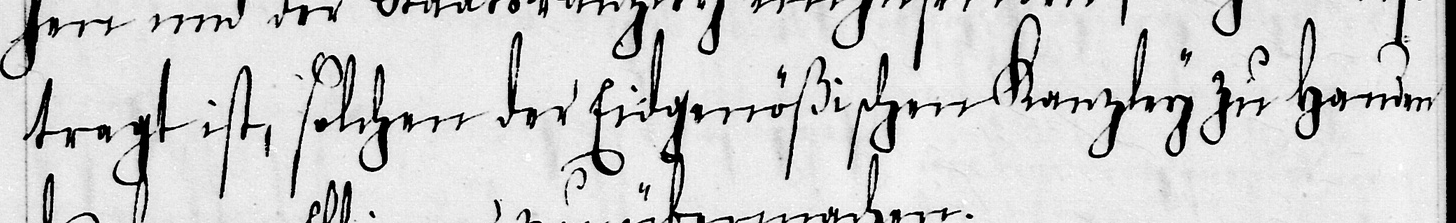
tragt ist, solchen der Eidgenößischen Kanzley zu Handen
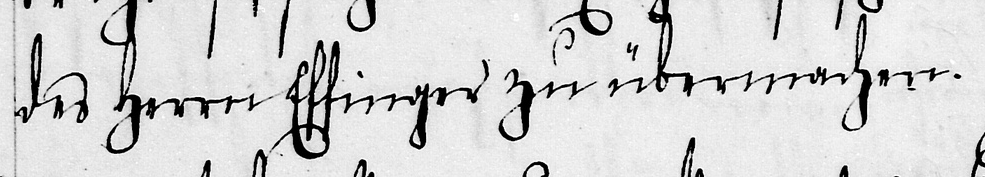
des Herrn Effinger zu übermachen.
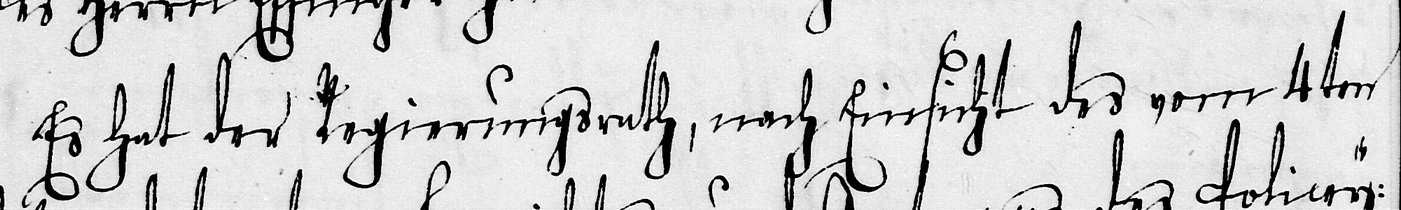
Es hat der Regierungsrath, nach Einsicht des vom 4ten
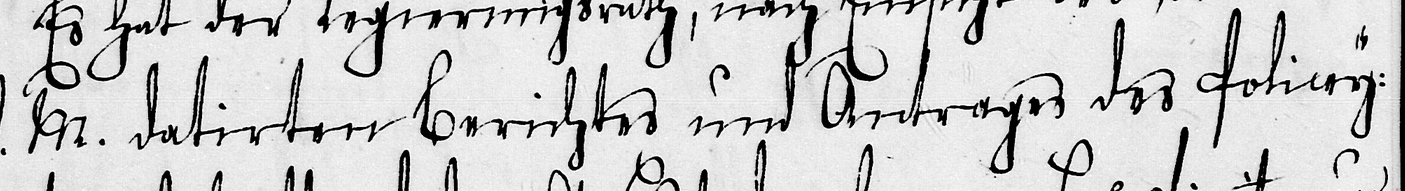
M. datirten Berichtes und Antrages des Policey¬
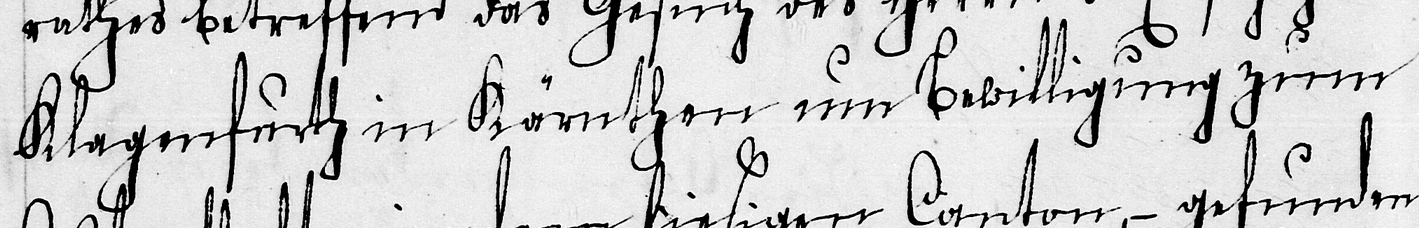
Klagenfurth in Kärnthen um Bewilligung zum
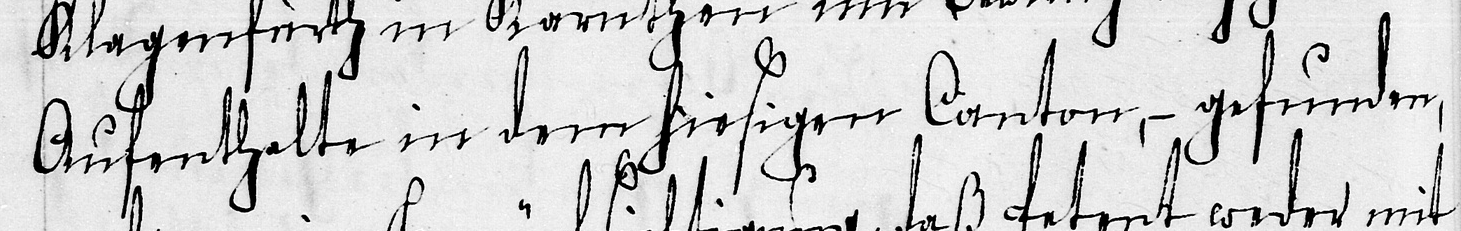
Aufenthalte in dem hiesigen Canton, – gefunden,
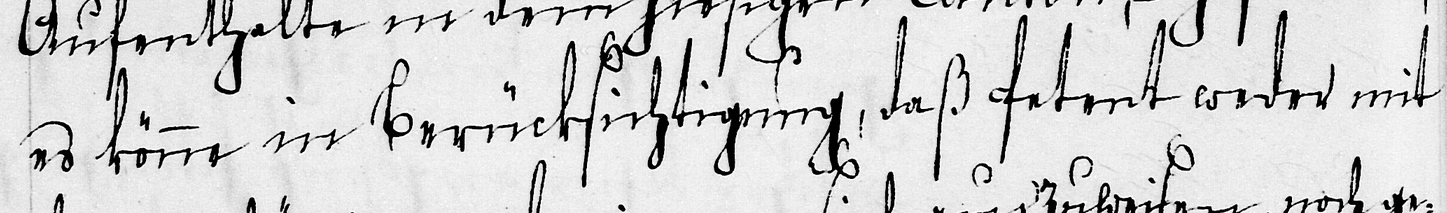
es könne in Berücksichtigung, daß Petent weder mit
